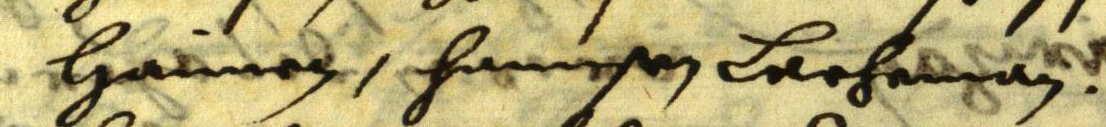Haimen, hannsen Locheman.
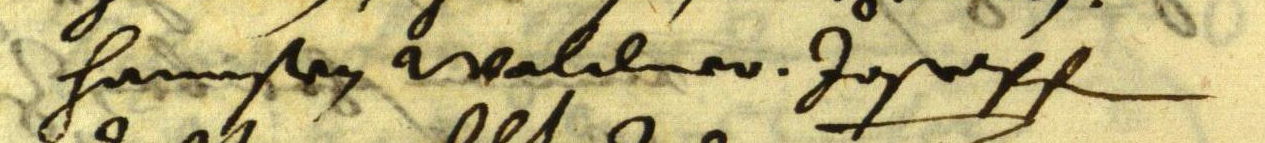hannsen Waldner. Joseff
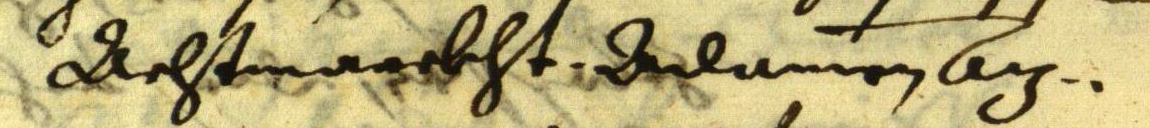Achtmarckht. Adamen Az¬
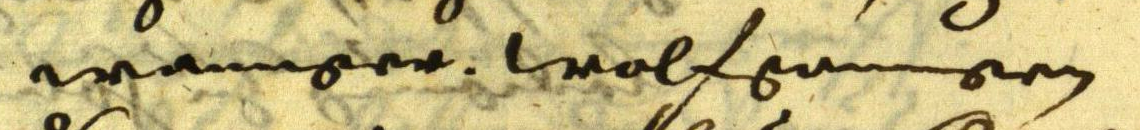wannger. Wolfganngen
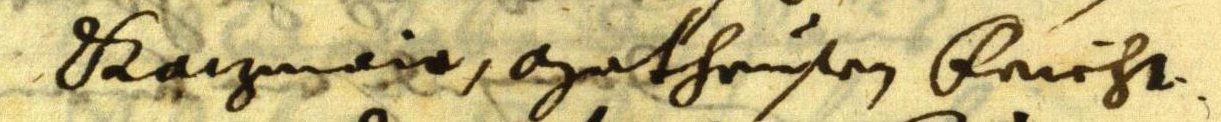Kazmair, Matheūsen Feicht¬
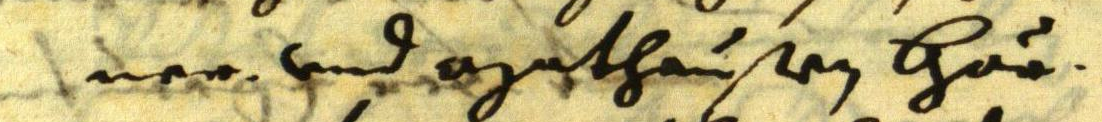ner. vnd Matheūsen Hōr¬
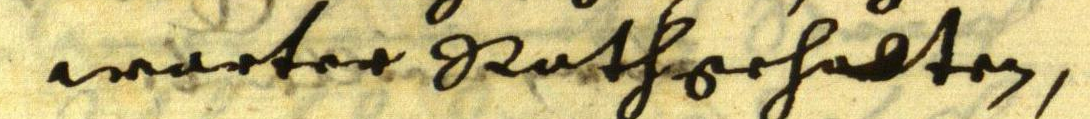warter Rath gehalten,
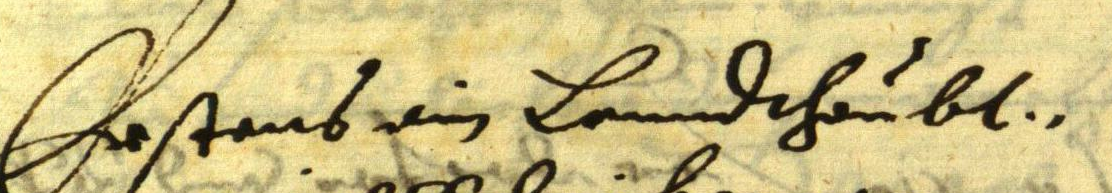Erstens ain Lanndthaūbt¬
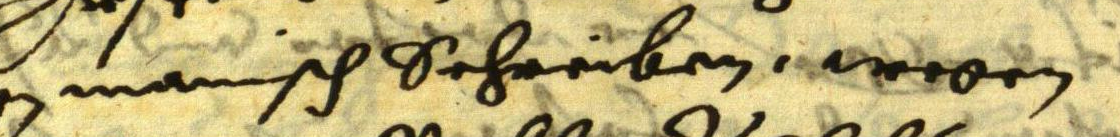manisch Schreiben, wegen
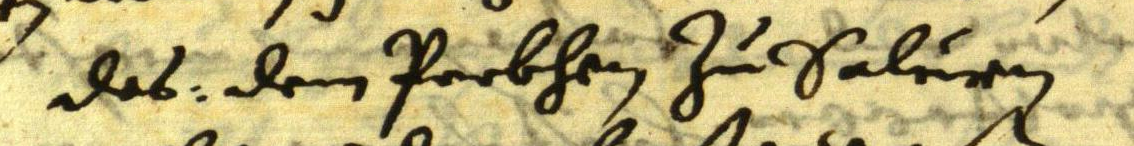des: dem Peckhen Zū Salūrn
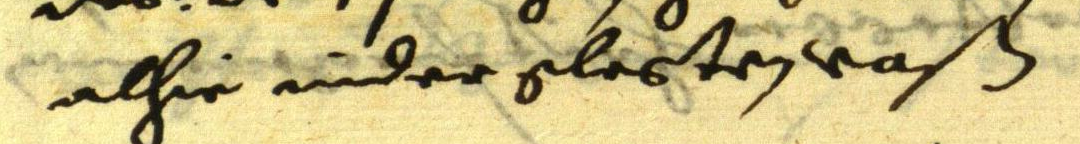alhie nider glegten vaß
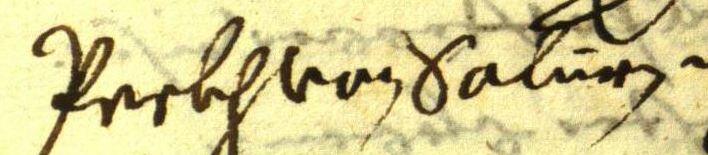Peckh von Salūrn
